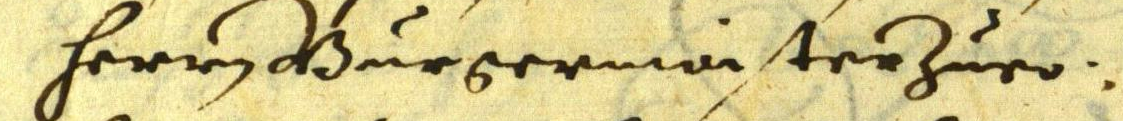herrn Būrgermaister Zūer¬
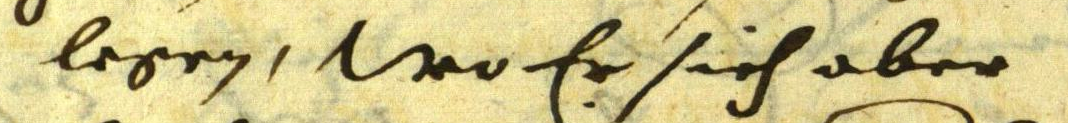legen, Wo Er sich aber
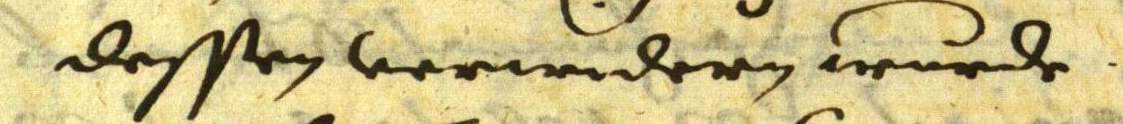dessen verwidern wūrde
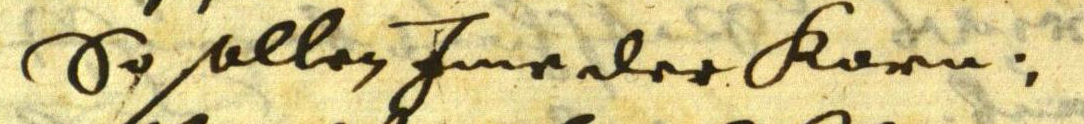So sollen Ime der Korn¬
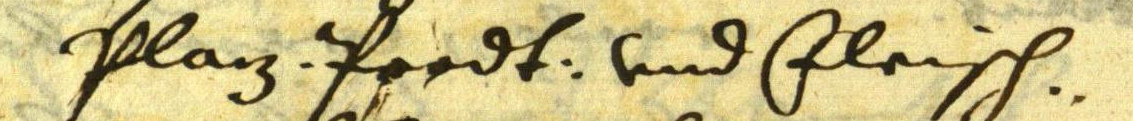Plaz. Prodt: vnd Fleisch¬
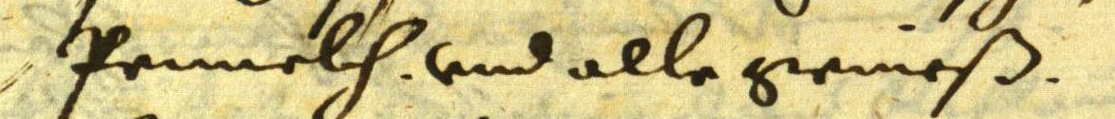Pennckh. vnd alle genieß.
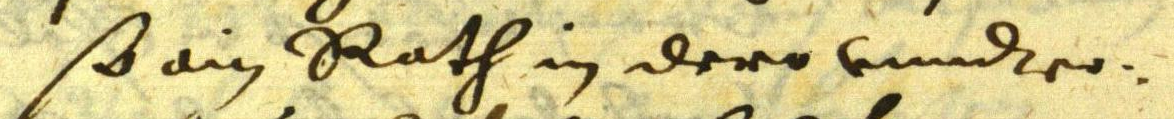so ain Rath in dero vnndter¬
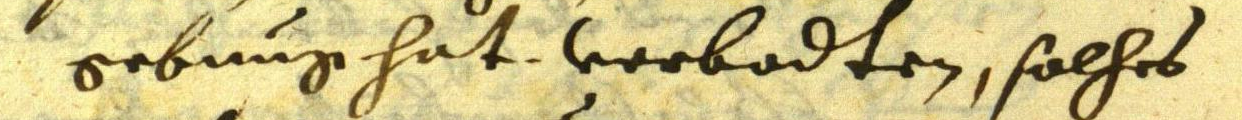gebūng hat. verboten, solhes
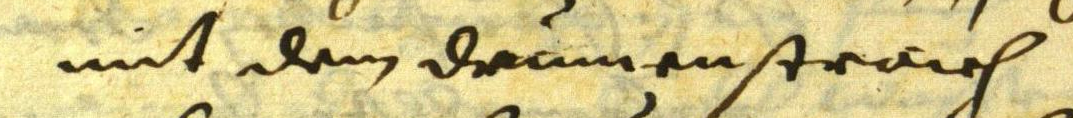mit dem drūmenstraich
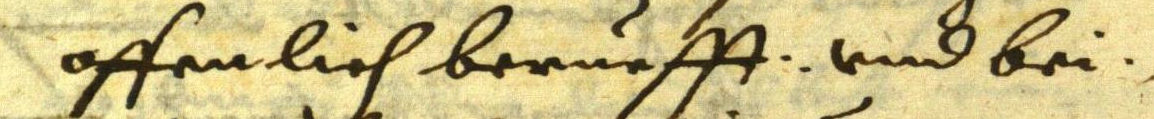offenlich berūefft: vnd bei¬
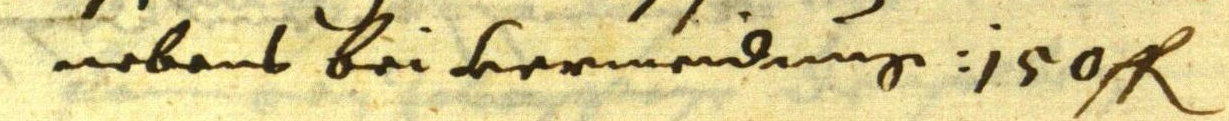nebens bei vermeidūng: 150 fl
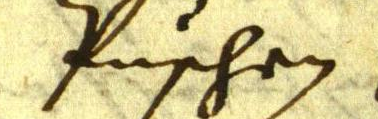Puschen
